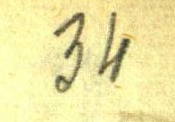34
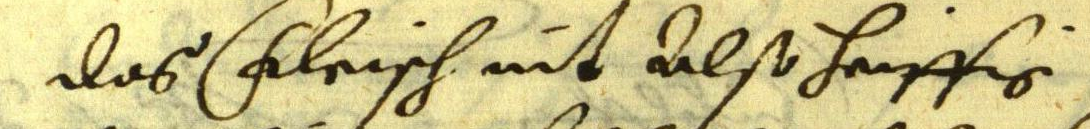das Fleisch nit Also heiffig
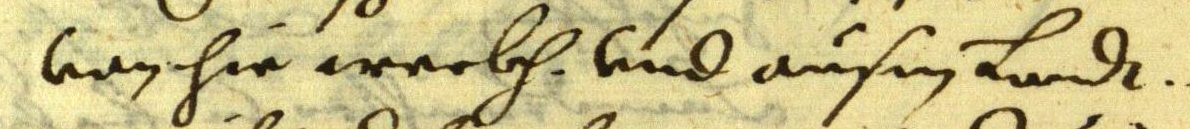von hie weckh. vnd aūsm Landt¬
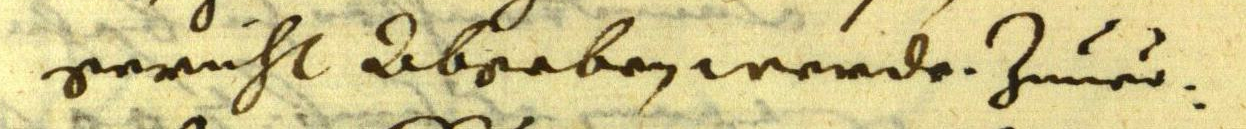gericht Abgeben werde. Zūver¬
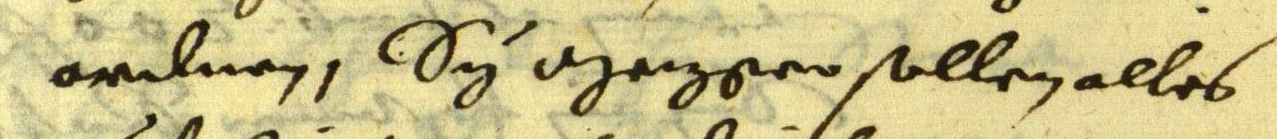ordnen, Sȳ Mezger sollen alles
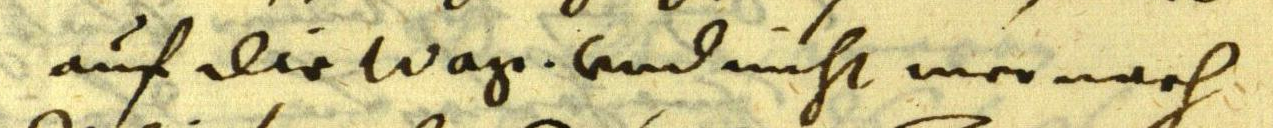aūf die Wag. vnd nicht mehr nach
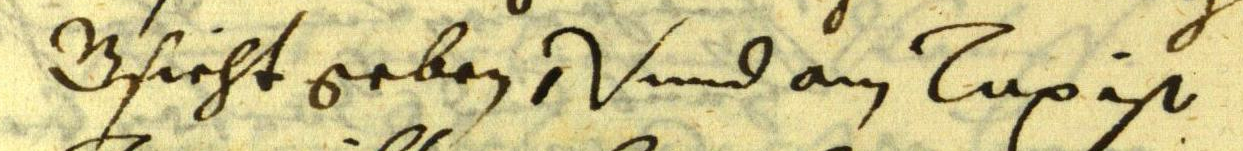Bsicht geben, Vnd am Tax ist
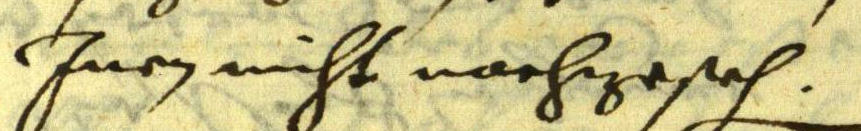Inen nicht nachzeseh.
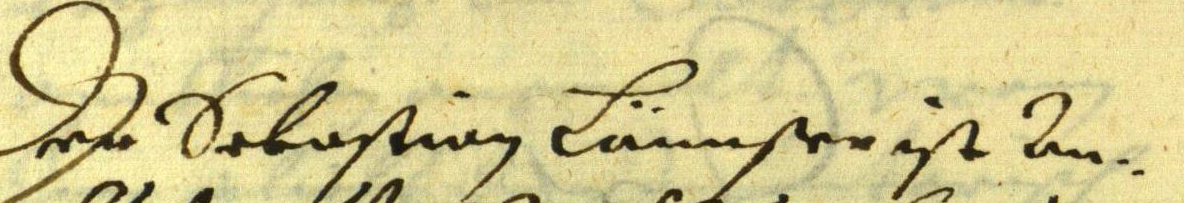Der Sebastian Lännser ist An¬
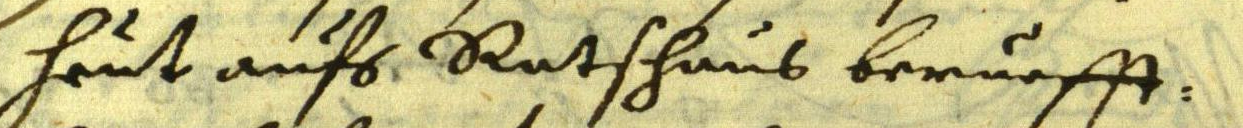heūt aūfs Ratshaūs berūefft¬
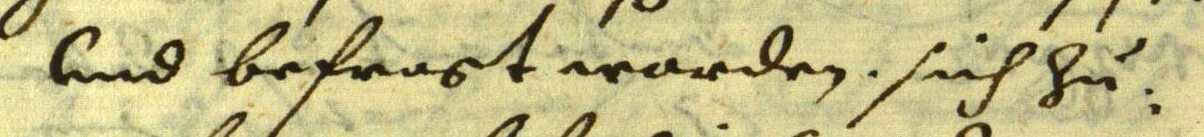vnd befragt worden, sich Zū¬
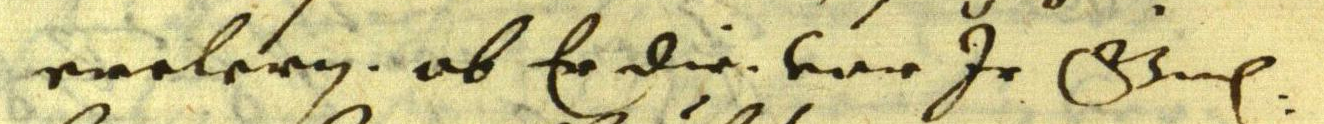ercleren. ob Er die vor Ir Gn:
